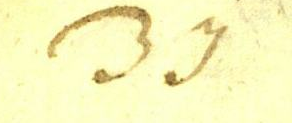31
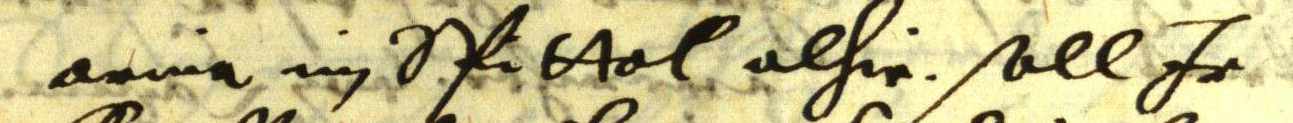arina im SPittal alhie. soll Ir
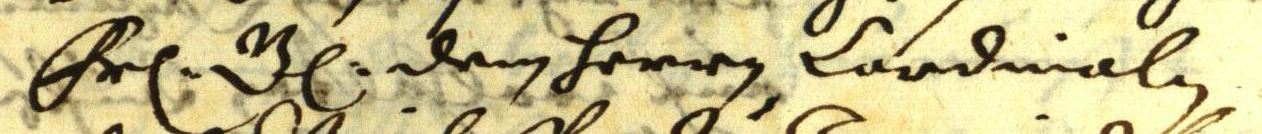Frl. G: dem Herrn Cardinaln
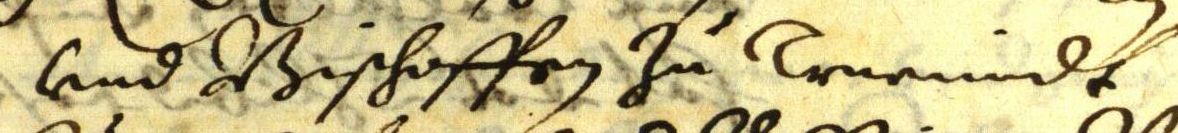vnd Bischoffen Zū Trienndt
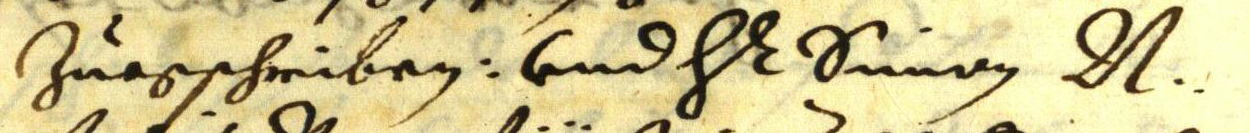Zūegeschriben: vnd hl Simon N.,
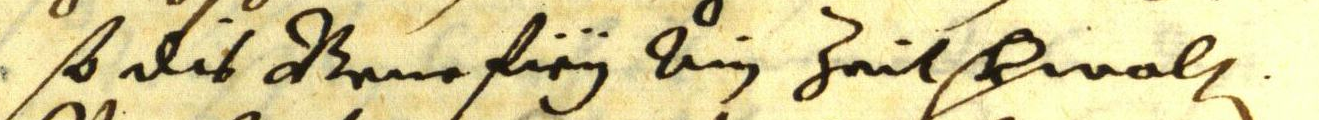so dis Beneficÿ Ain Zeit vwalt
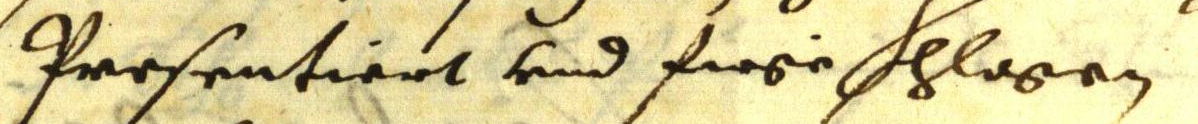Presentiert vnd firge schlagen
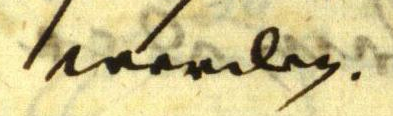werden.
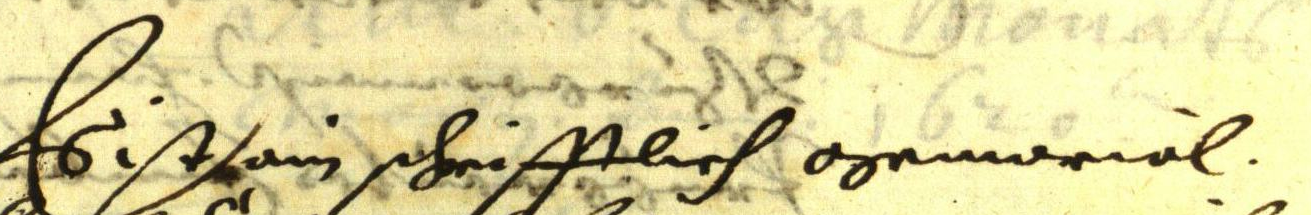Es ist ain schrifftlich Memorial.
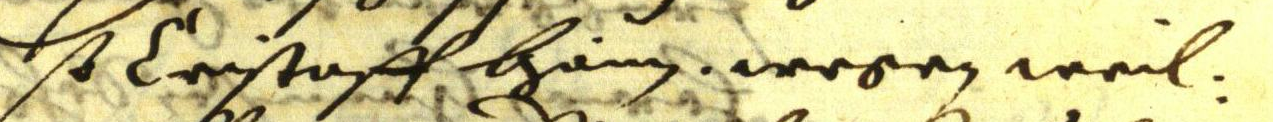So Cristoff Haim. wegen weil¬
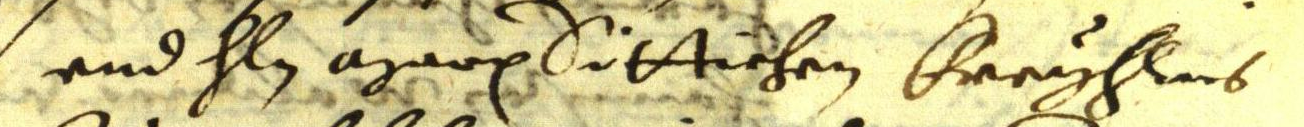end hln Marx Sittichen Freȳherrns
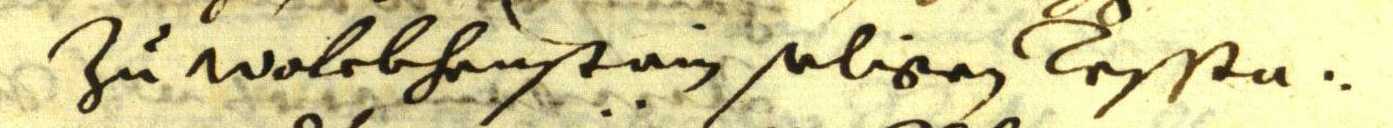Zū Wolckhenstain seligen Tessta¬
